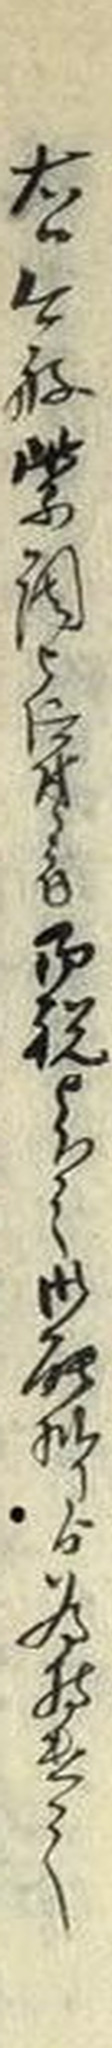右ハ今般紫調被仰付候ニ付御祝被下之御能掛りゟ為持遣之

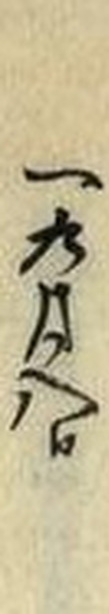一九月十日
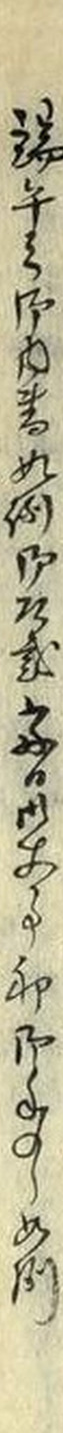端午之御内書如例御頂戴当日御使事初御手のし如例
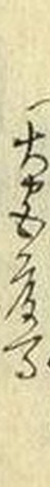大宮藤馬
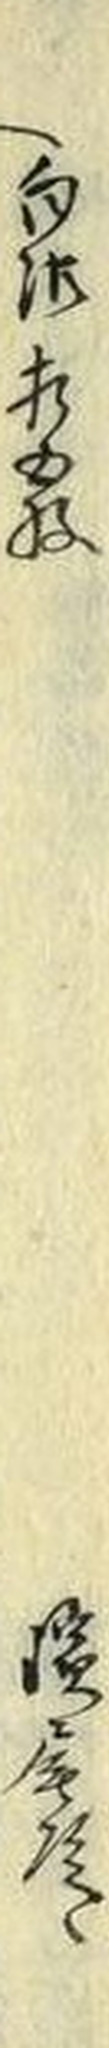白銀拾五枚浜尾殿へ
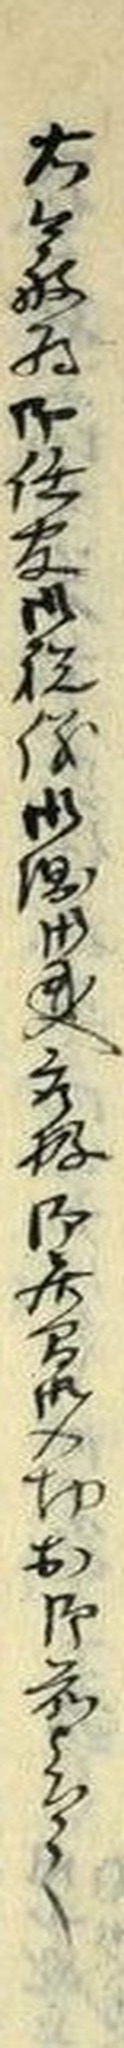右今般為御任官御祝儀御側御用人取扱御居間御〆切於御前被下之
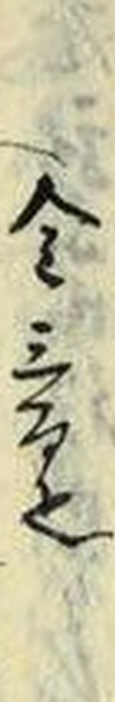金三百疋
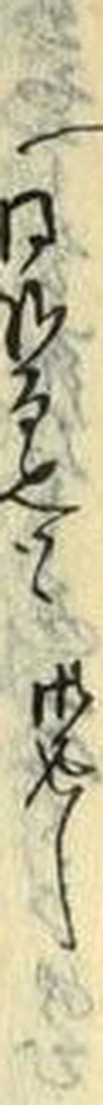同弐百疋ツヽ御返し
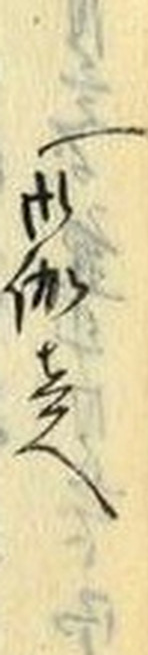御伽壱人
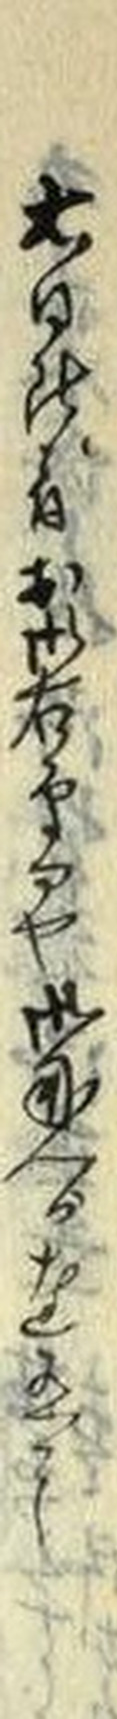右同断ニ付於御右筆部屋御用人ゟ達有之
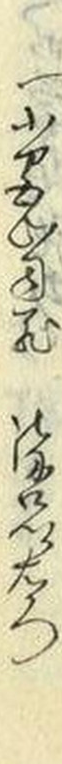小宮山周蔵溝口郷右衛門
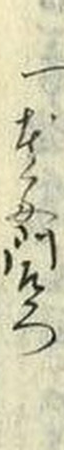本多門左衛門
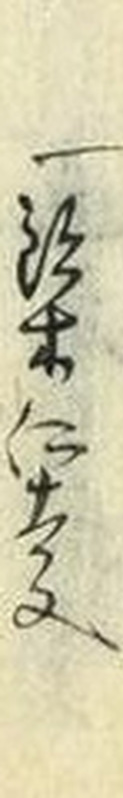鈴木仁太夫
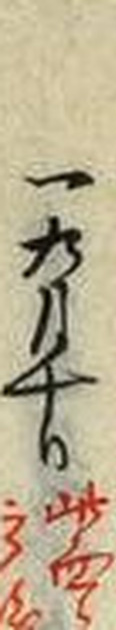一九月十日
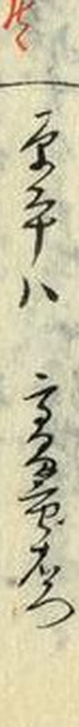原平八高畠市郎右衛門
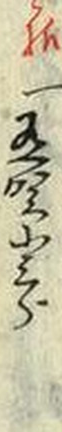有賀小三郎
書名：少傅日録抄（斉善付側向頭取日記、在府）
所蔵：福井県文書館 Fukui Prefectural Archives
